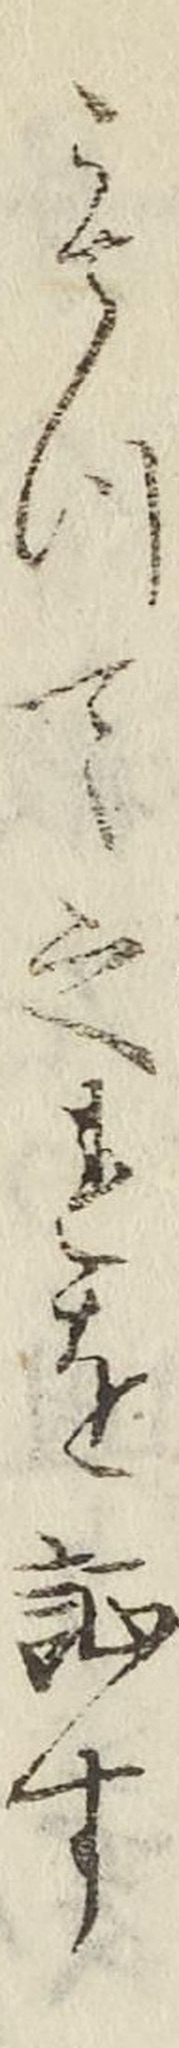もつて之れを証す
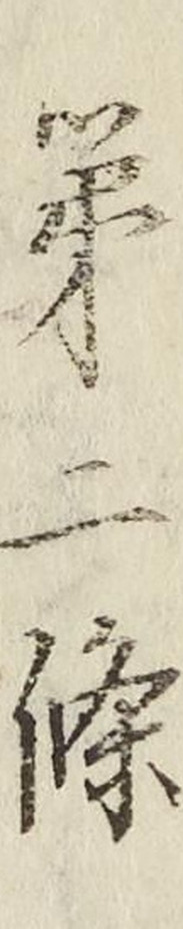第二條
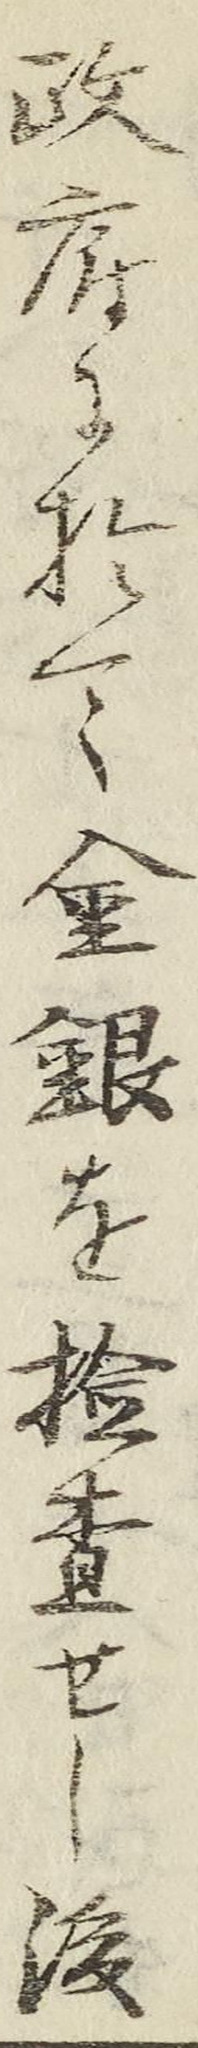政府に於て金銀を検査せし後
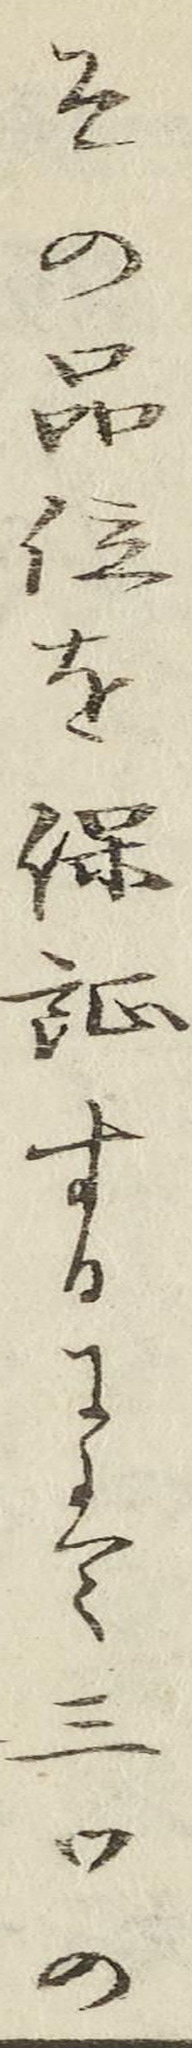その品位を保証するには三ツの
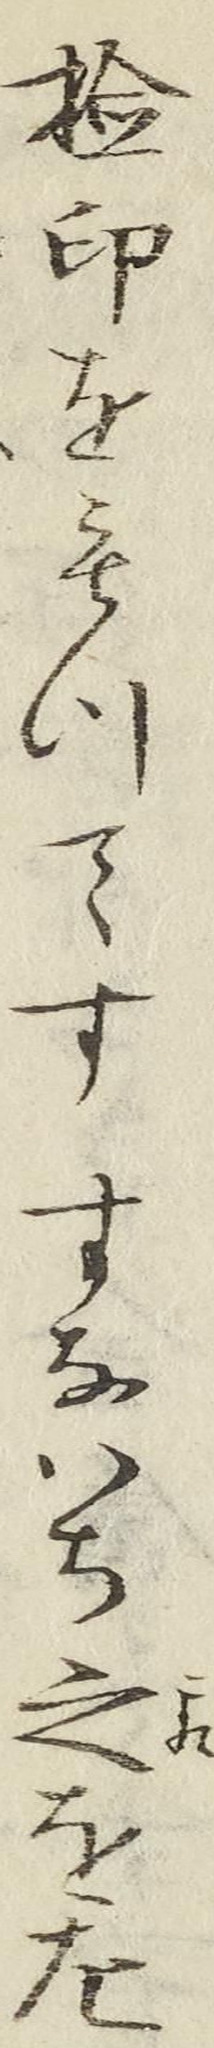検印をもつてすすなはち之を左
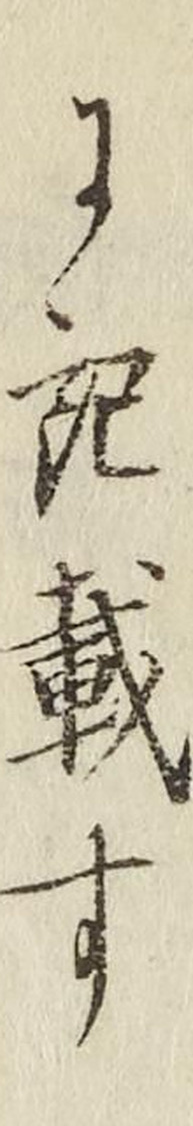に記載す
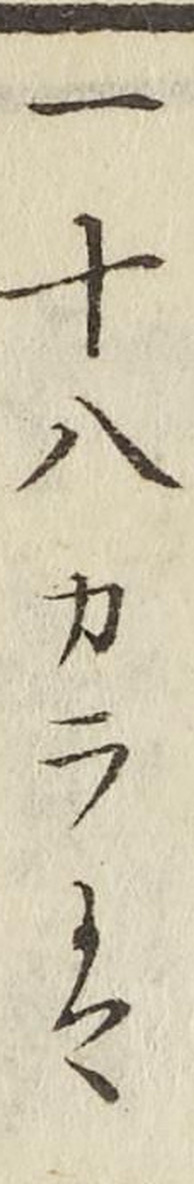一十八カラは
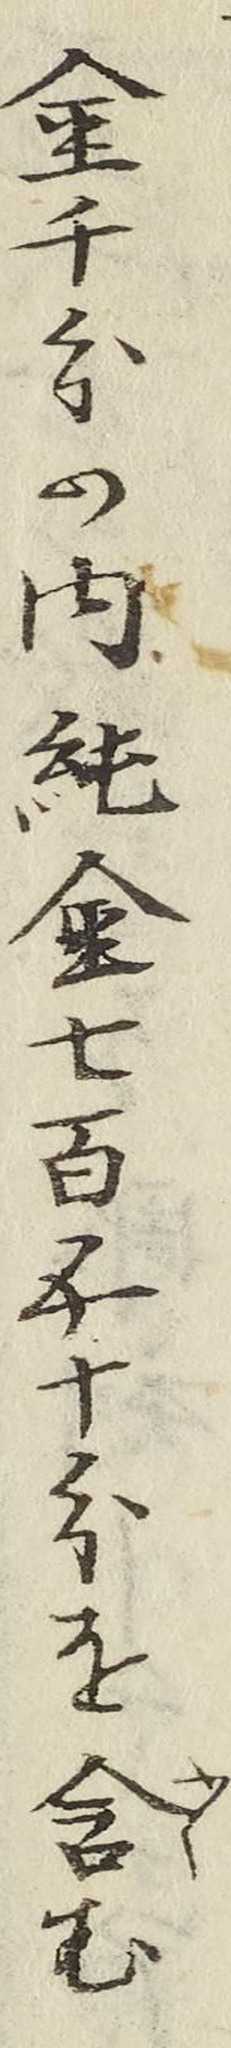金千分の内純金七百五十分を含む
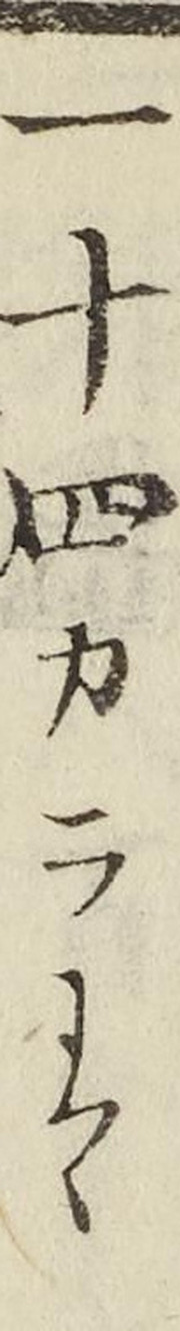一十四カラは
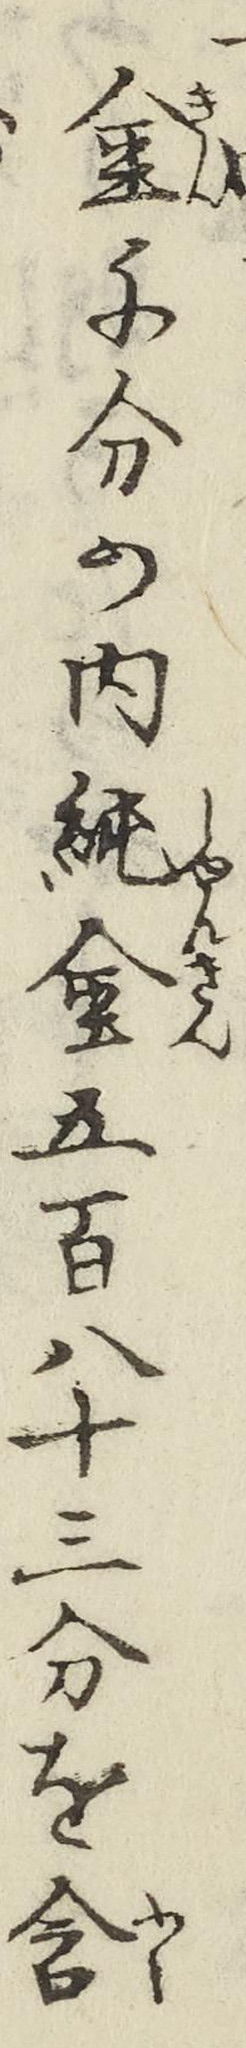金千分の内純金五百八十三分を含
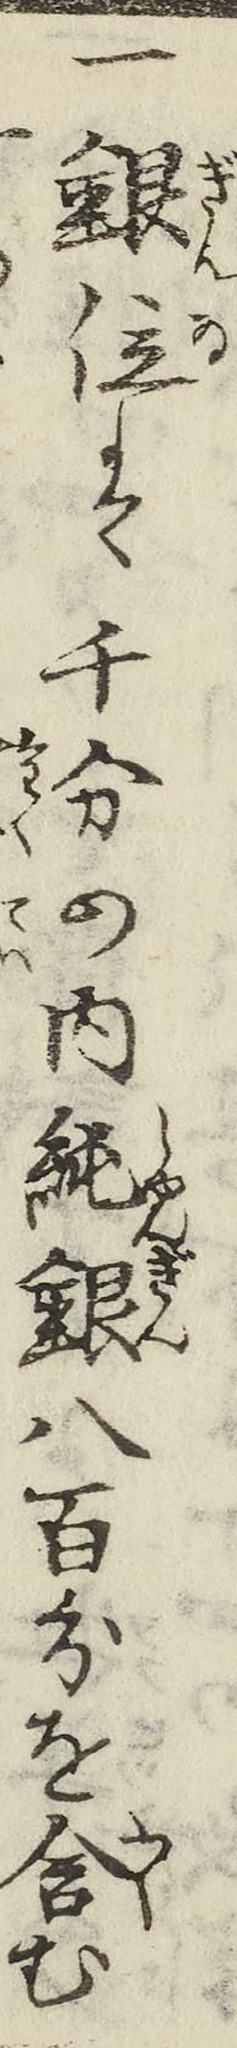一銀位は千分の内純金八百分を含む
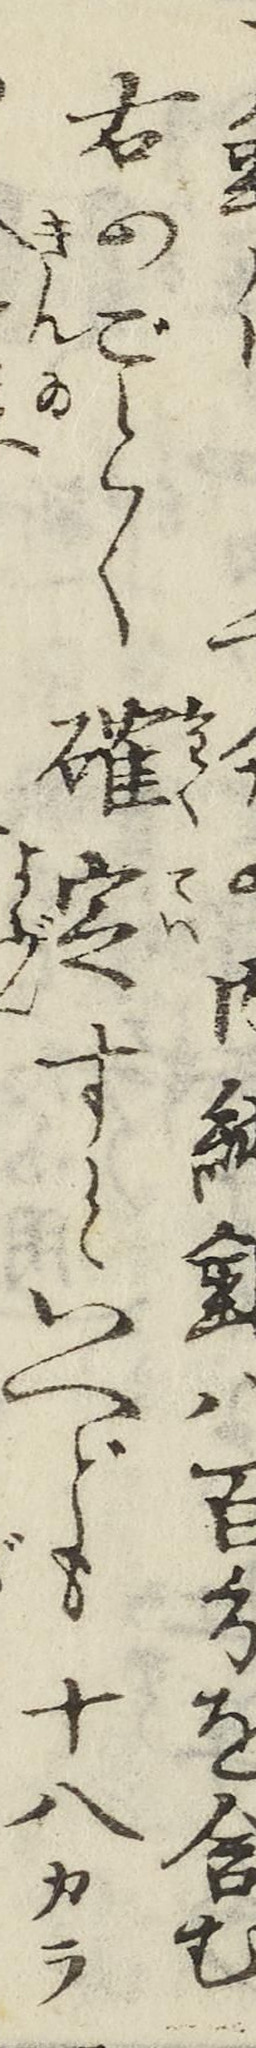右のごとく確定すといへども十八カラ
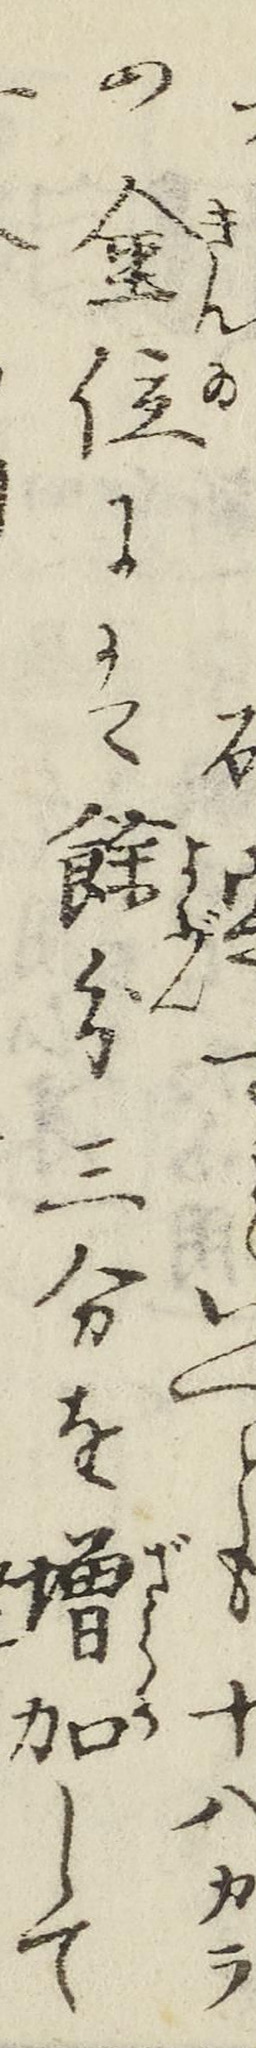の金位には余分三分を増加して
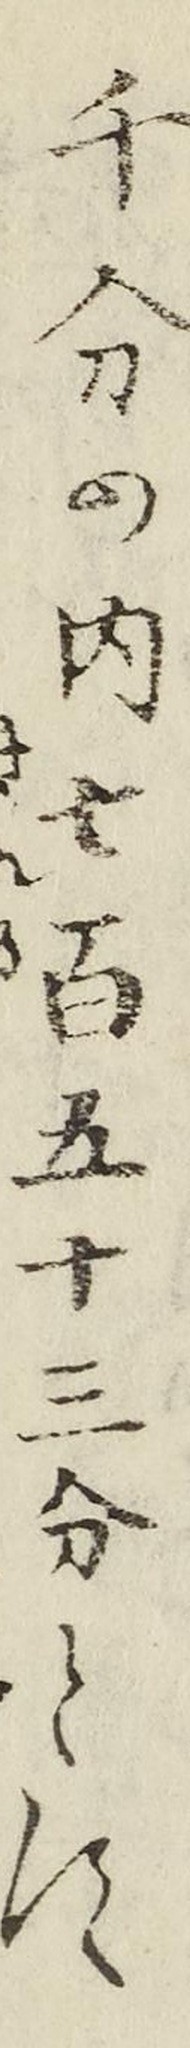千分の内七百五十三分とす
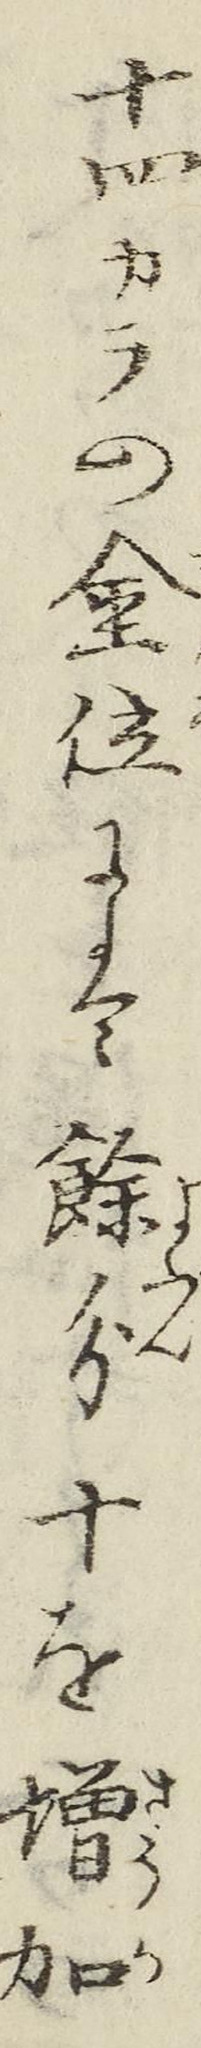十四カラの金位には余分十を増加
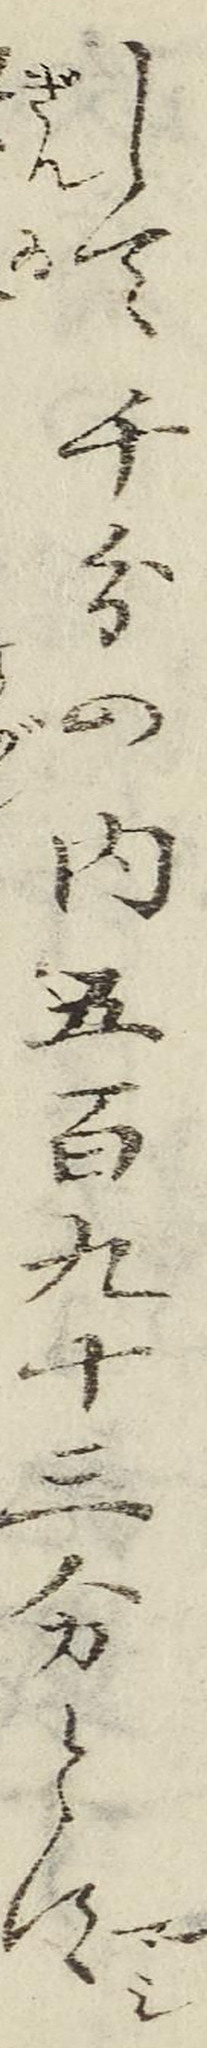して千分の内五百九十三分とす
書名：[時計に関する冊子]
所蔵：東京大学地震研究所図書室 Earthquake Research Institute Library, The University of Tokyo, JAPAN
